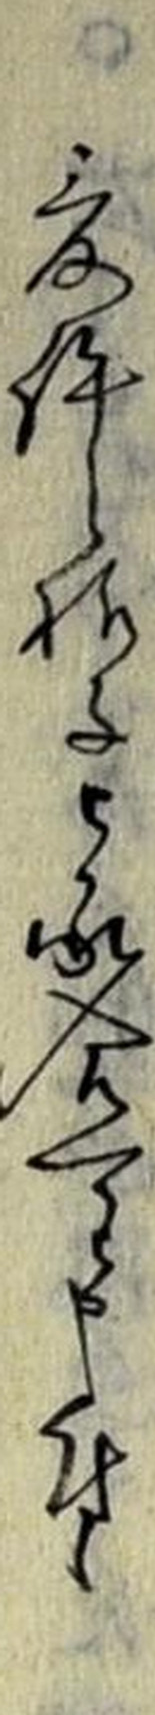爰許之様子被承合可被申付候
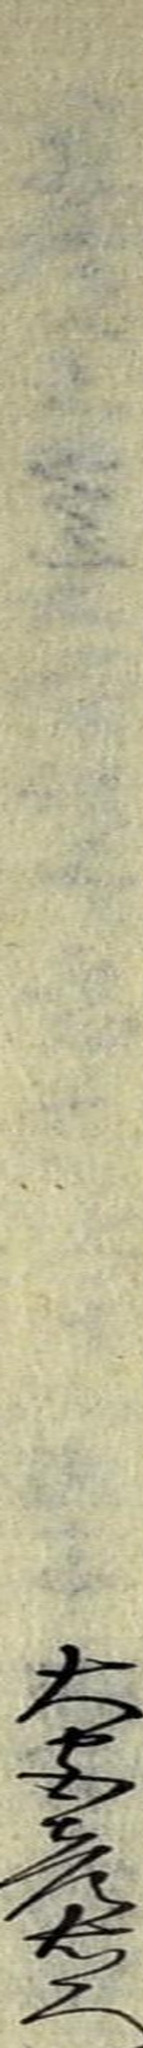大宮彦右衛門
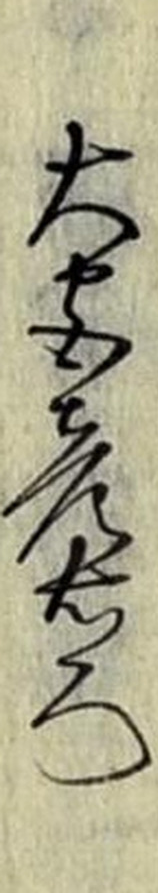大宮彦右衛門
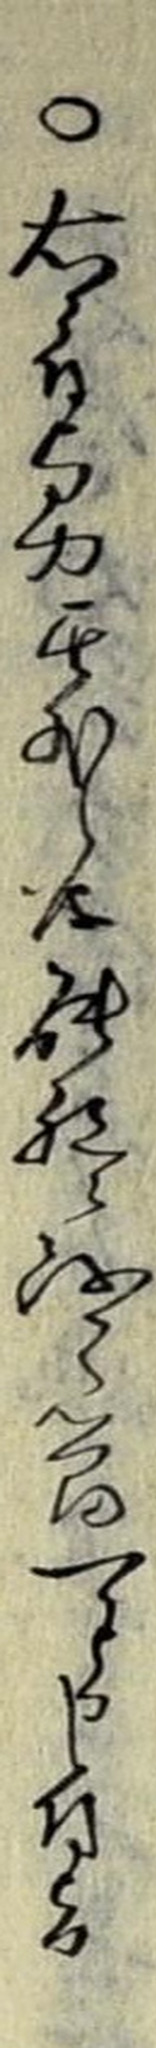〇右ニ付与力其外之儀能程ニ致了簡可被申付旨
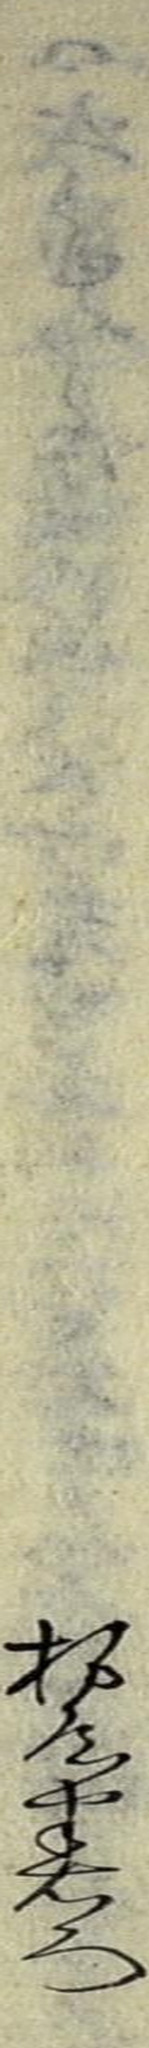栃屋半右衛門
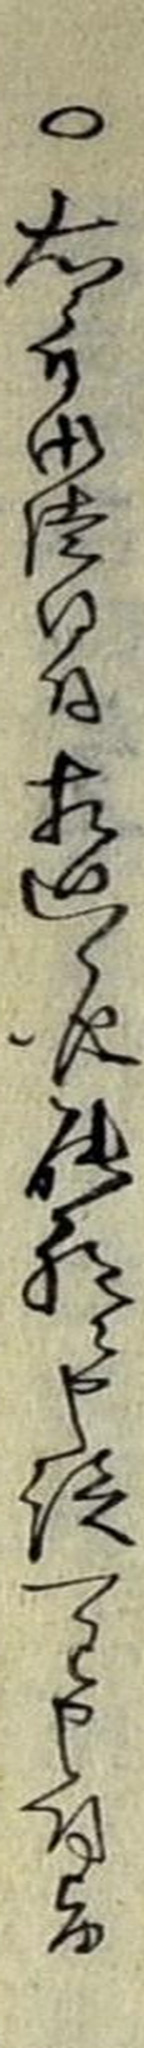〇右ニ付御徒目付相廻候儀能程ニ申談可被申付旨
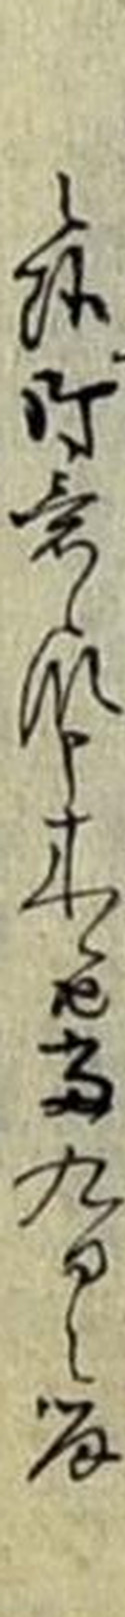之趣御意之段申来候由当九日之留
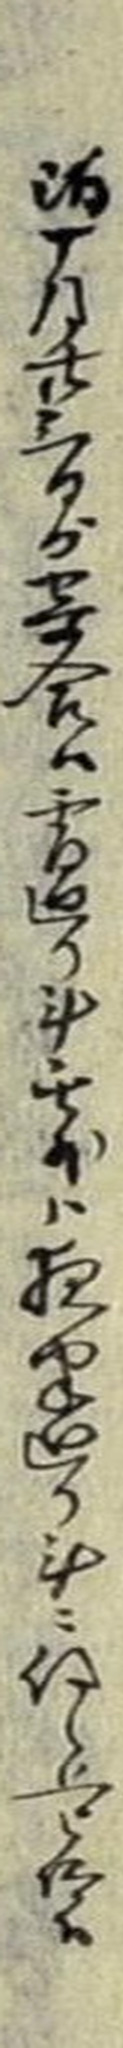附十月廿三日ゟ寄合ハ宵廻り斗其外ハ夜半廻り斗ニ伺之上被仰付
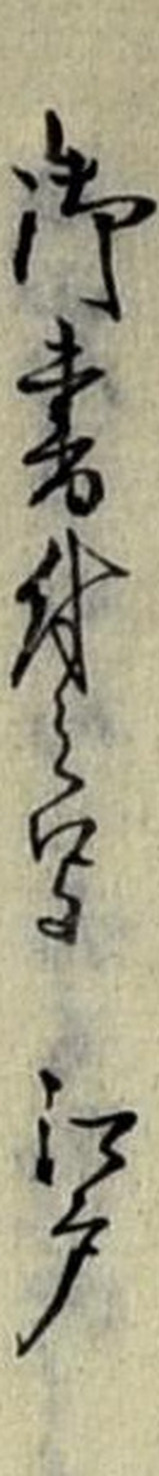御書付之写江戸
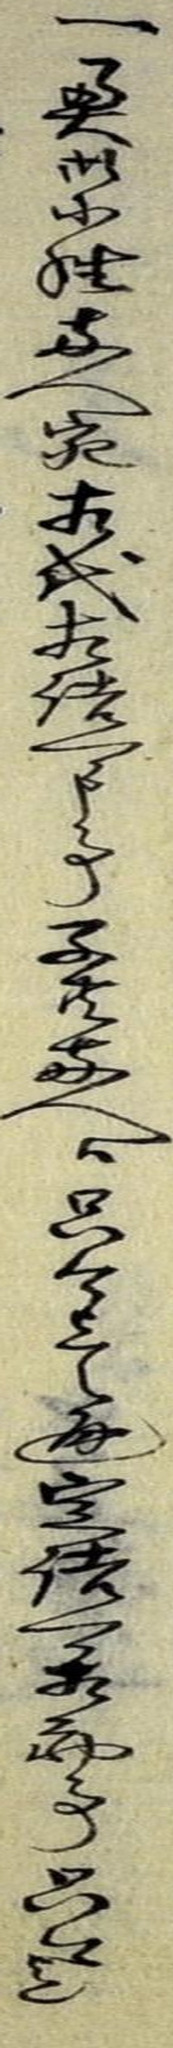一奥御小姓両人宛相代相詰可申事子共両人ハ只今迄之通定詰可相勤事只今迄
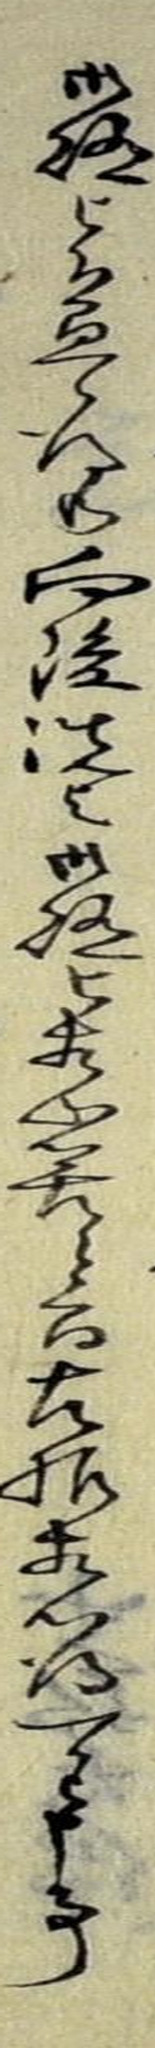御賄被下置候得共向後洗与御賄被相止筈ニ候間左様相心得可被申事
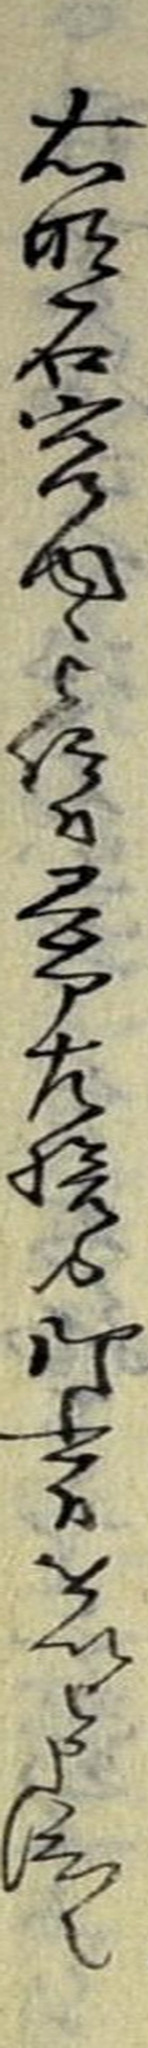右明石宮内へ被仰付岡部左膳方御書付を以被申渡之
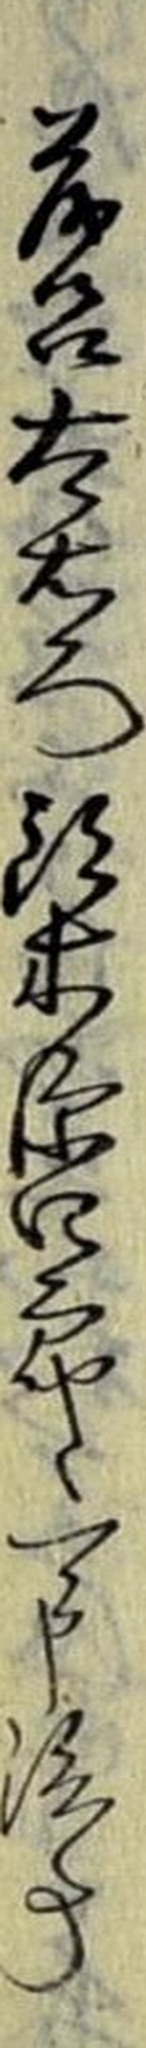茂呂太右衛門鈴木源四郎へ可申渡事
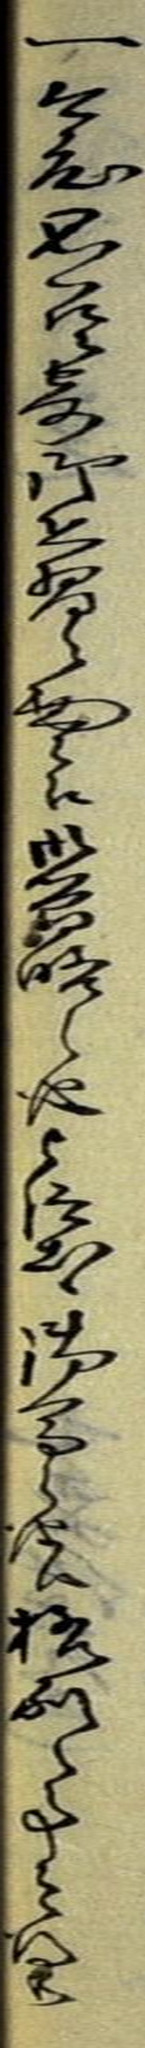一今度思召ニ寄御近習之面々江御簡略之儀被仰出候御馬之儀ハ格別之事ニ候得共
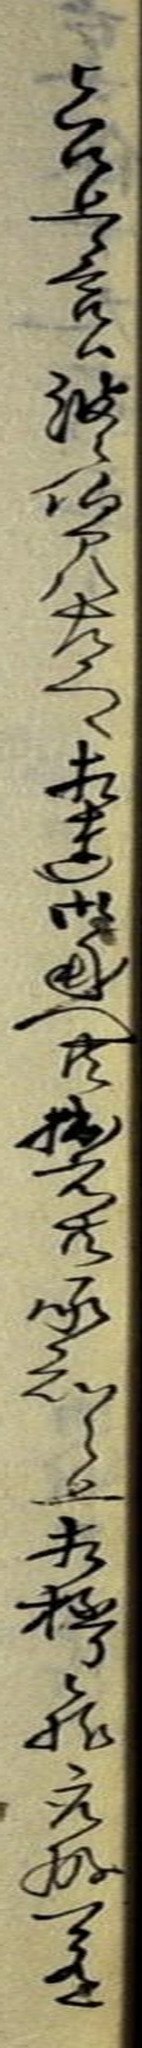被召上候節ハ波々伯部八左衛門へ相達御用人共拙者共承知之上相極り候様取扱可有
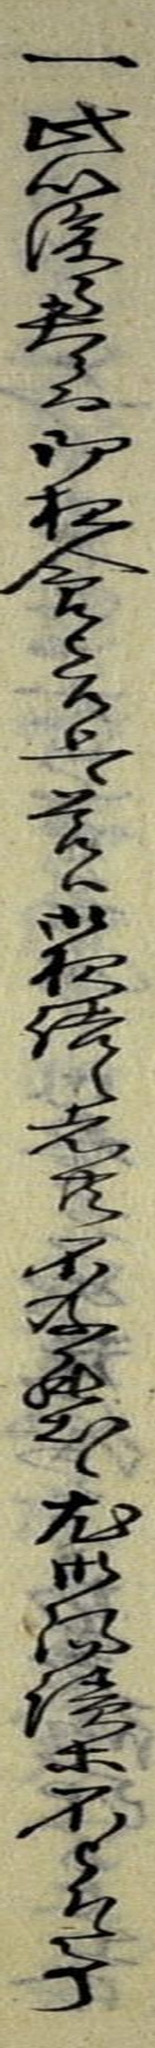一此以後奥ニ而御夜食被召上候節ハ御夜詰之者共不及罷出候尤御湯漬等不被下候事
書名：命令之部 一
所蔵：福井県文書館 Fukui Prefectural Archives
